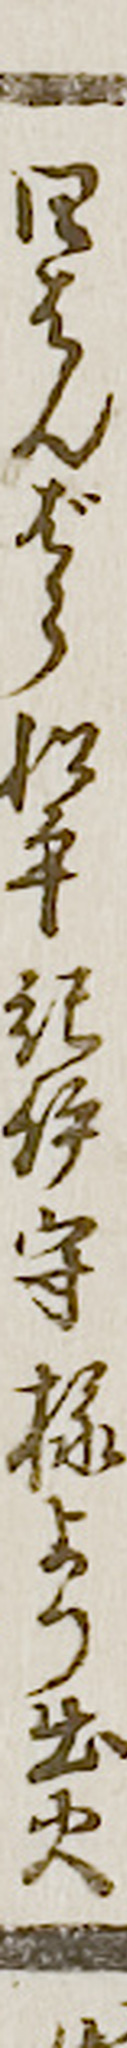四はんばら松平紀伊守様より出火
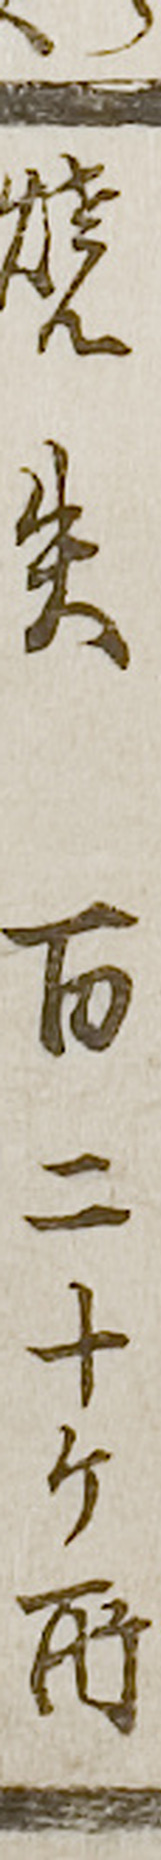焼失百二十ケ所
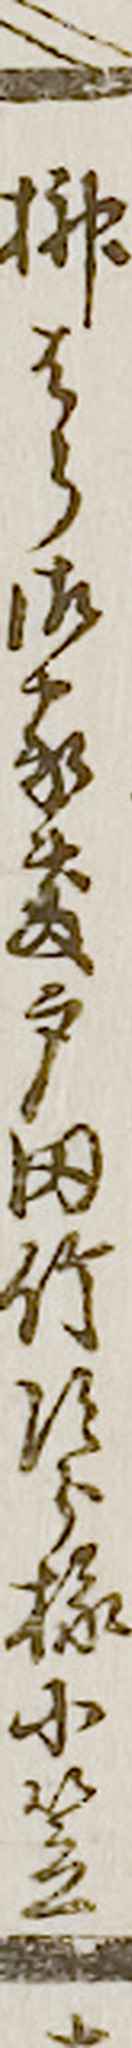榊はら御家敷戸田竹治郎様小笠
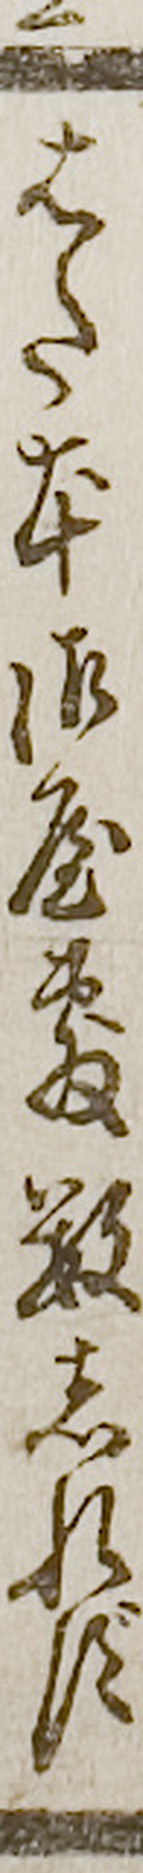はた本御屋敷数しれず
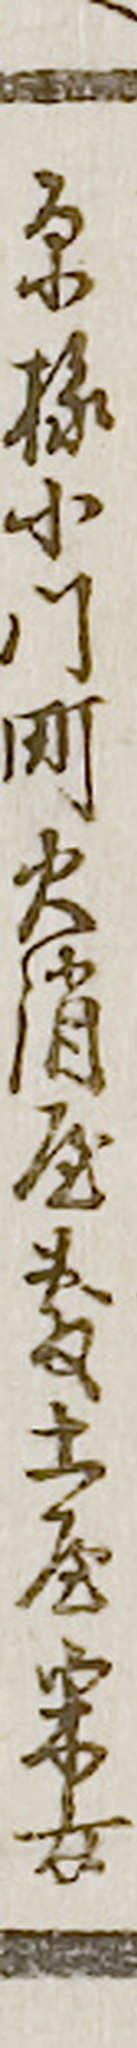原様小川町火消屋敷土屋采女
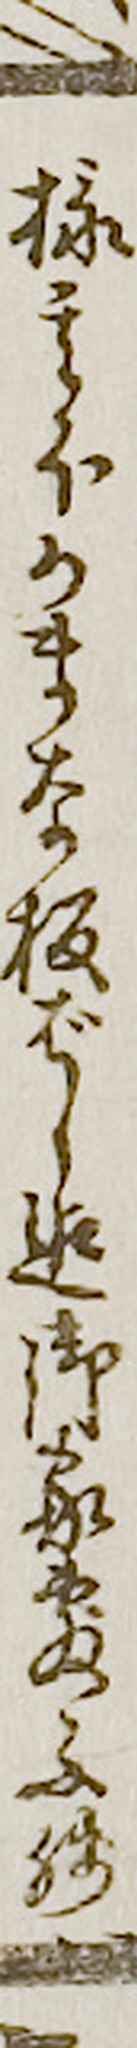様其外うまな板ばし迄大家敷不残
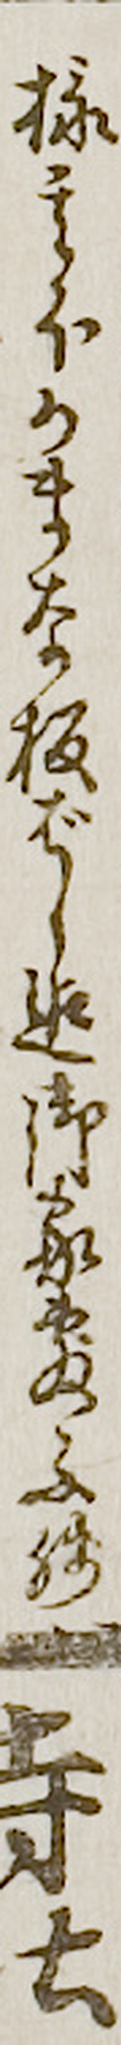様其外うまな板ばし迄大家敷不残
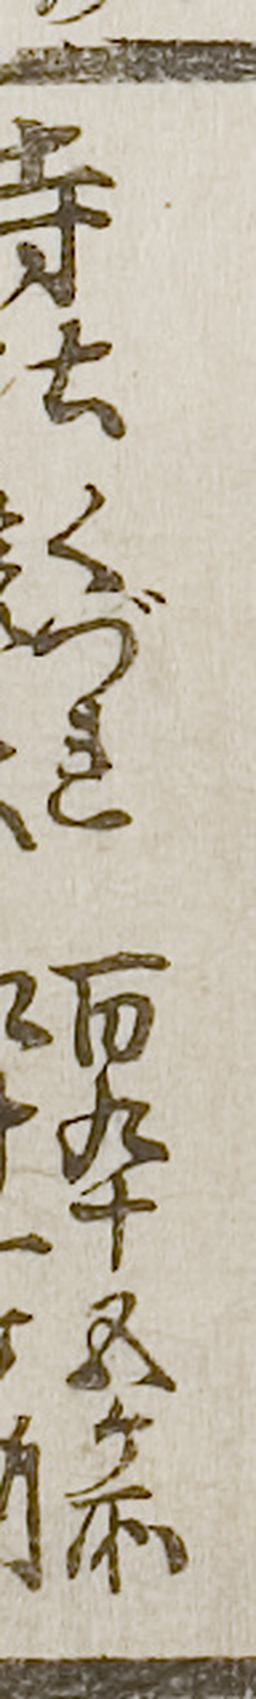寺社くづれ百九十五ケ所
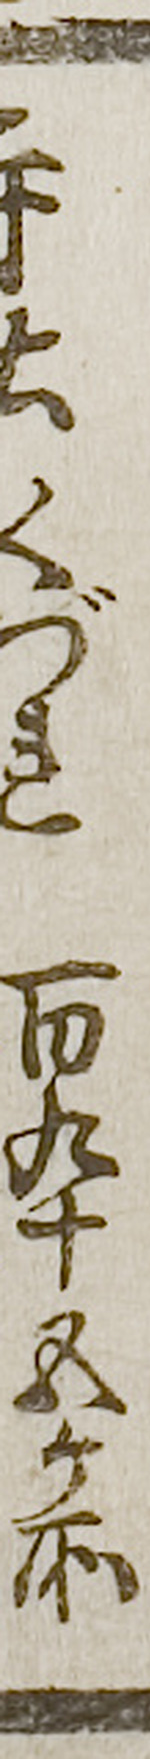寺社くづれ百九十五ケ所
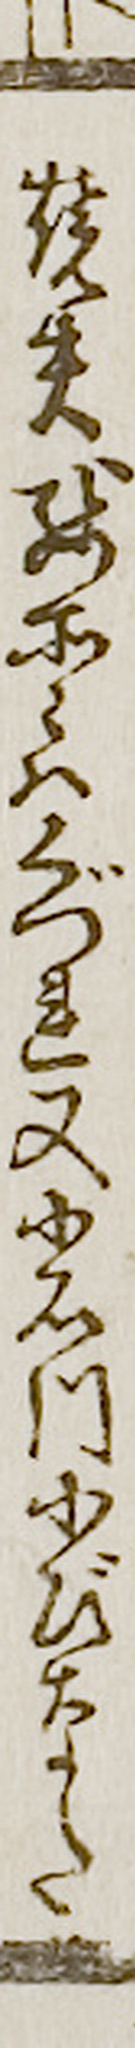焼失残所二ハくづれ又小石川小びなた
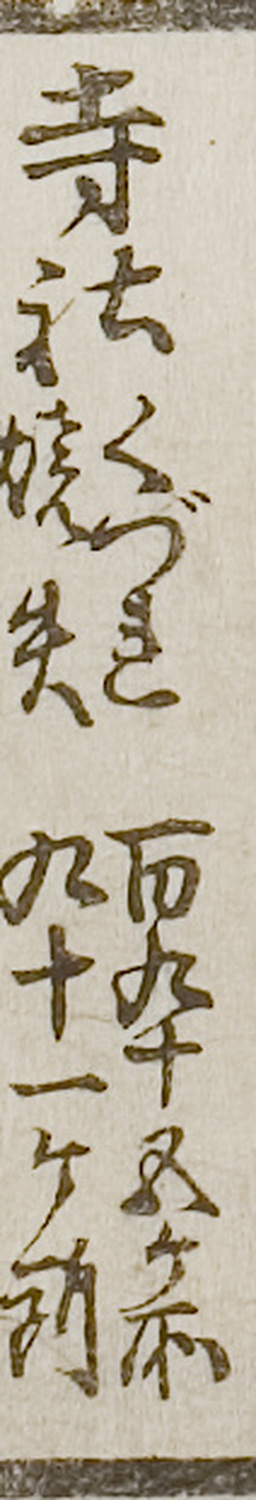同焼失九十一ケ所
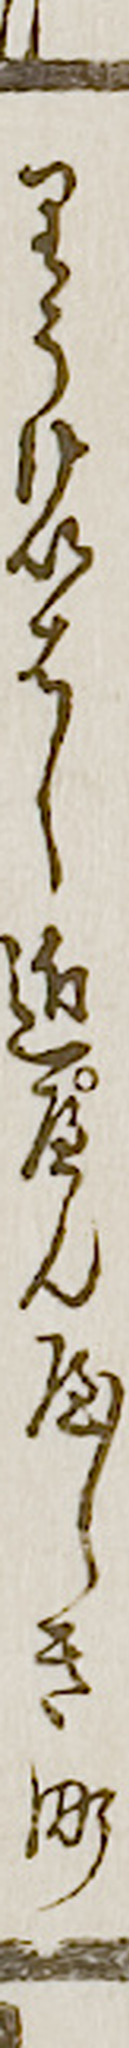りうけいはし近ぺん屋しき町
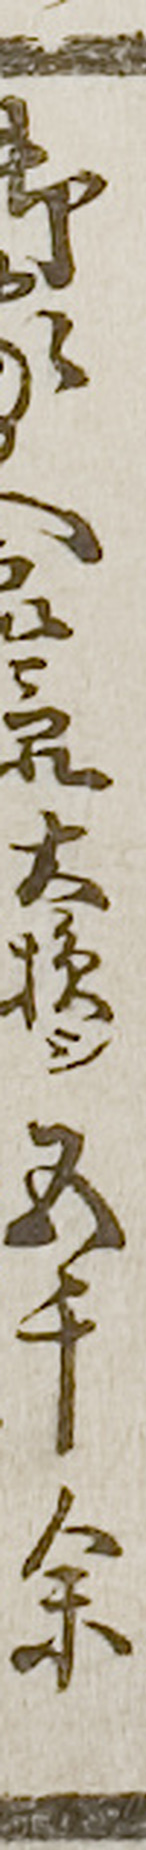御家人衆様大損じ五千余
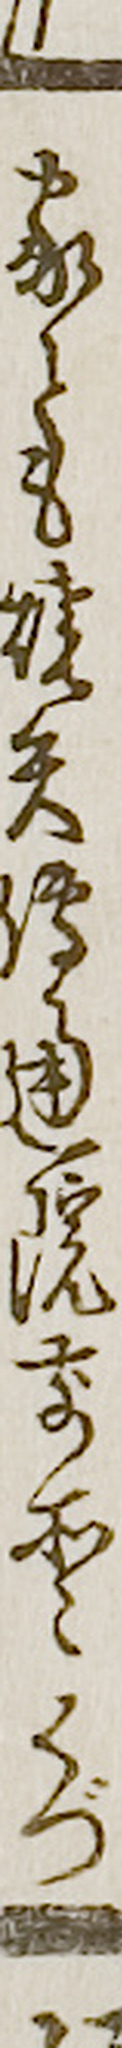家とも消失伝通院前所々くづ
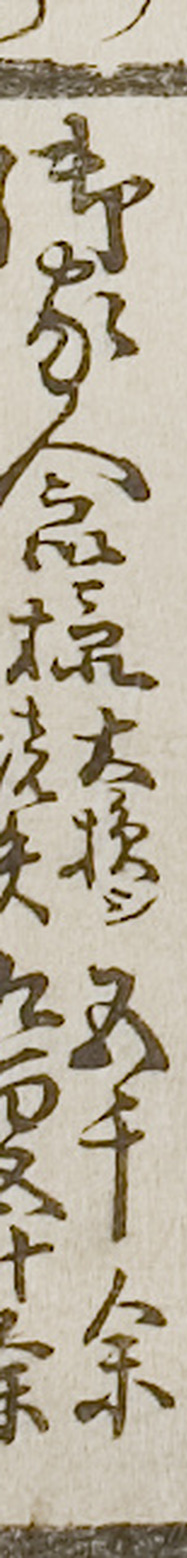御家人衆様大損じ五千余
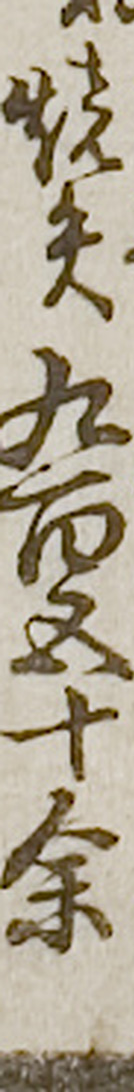同焼失九百五十余
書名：安政二乙卯歳十月二日夜ル四ツ時震始メ末代
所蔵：東京大学総合図書館 General Library in the University of Tokyo, JAPAN
